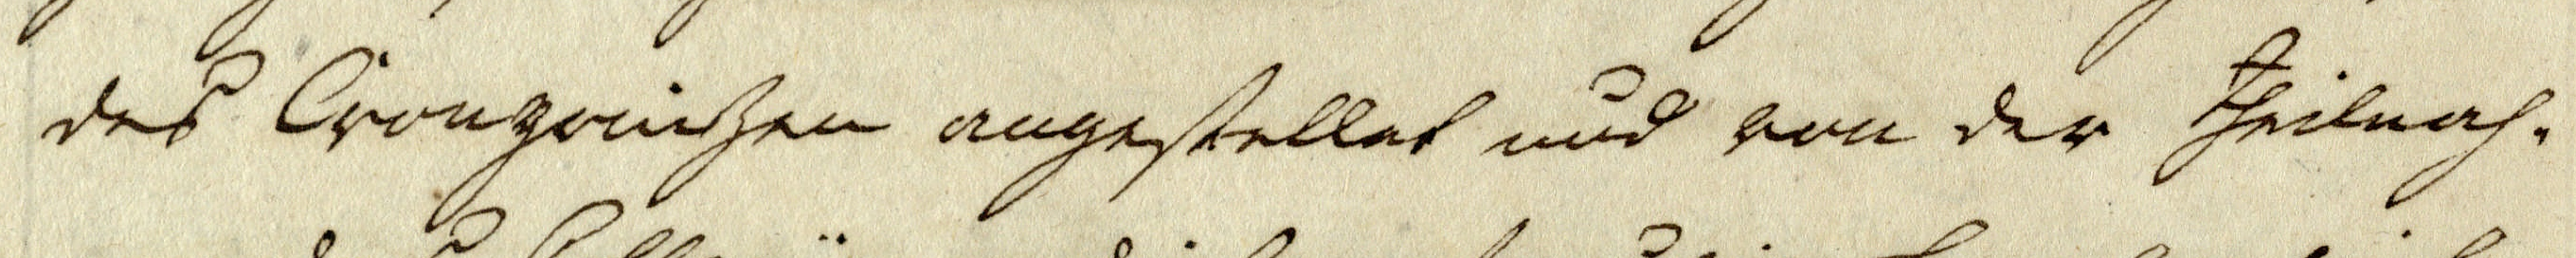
des Cronprinzen angestellet und von der Theilnah¬
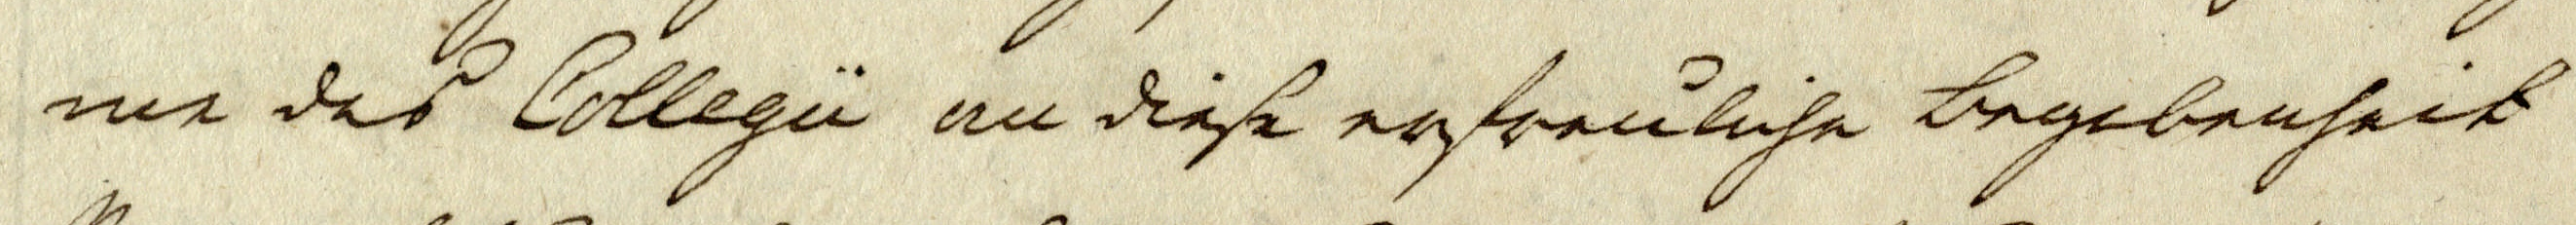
me des Collegii an diese erfreuliche Begebenheit
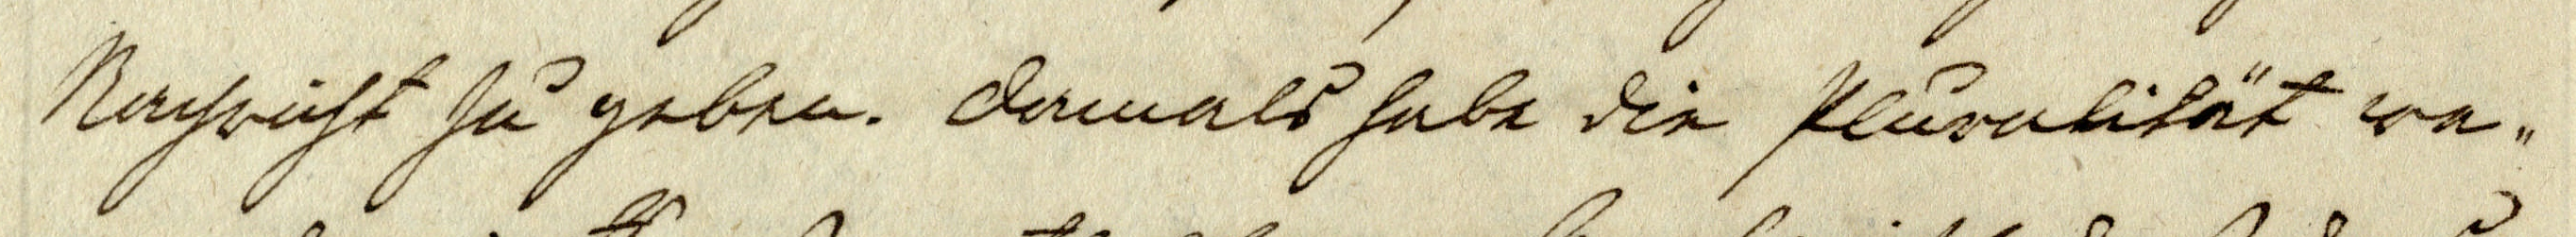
Nachricht zu geben. Damals habe die Pluralität we¬
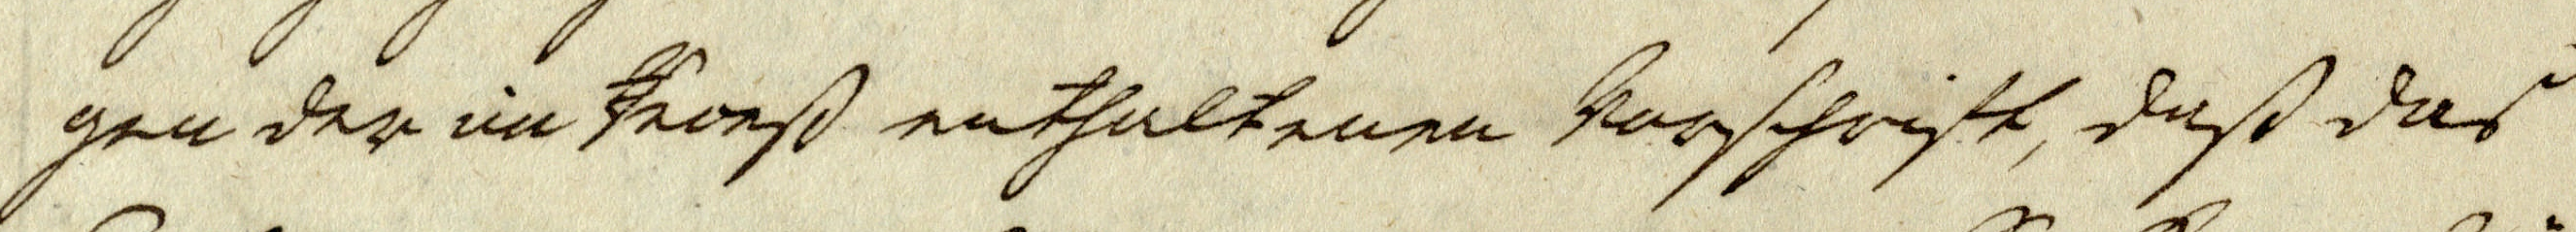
gen der in Receß enthaltenen Vorschrift, daß das
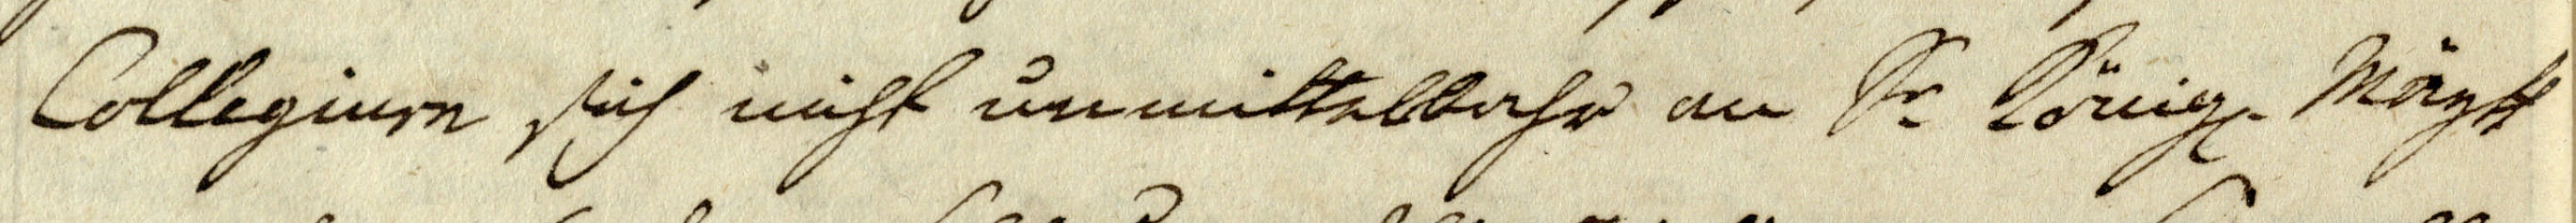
Collegium sich nicht ummittelbahr an Sr Königl. Maÿtt.
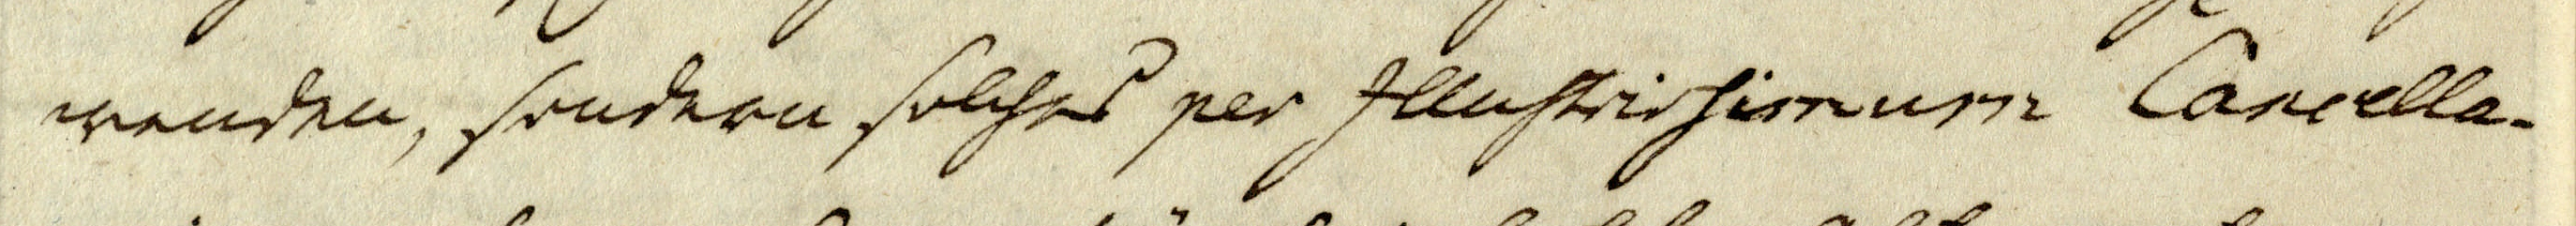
wenden, sondern solches per Illustrissimum Cancella¬
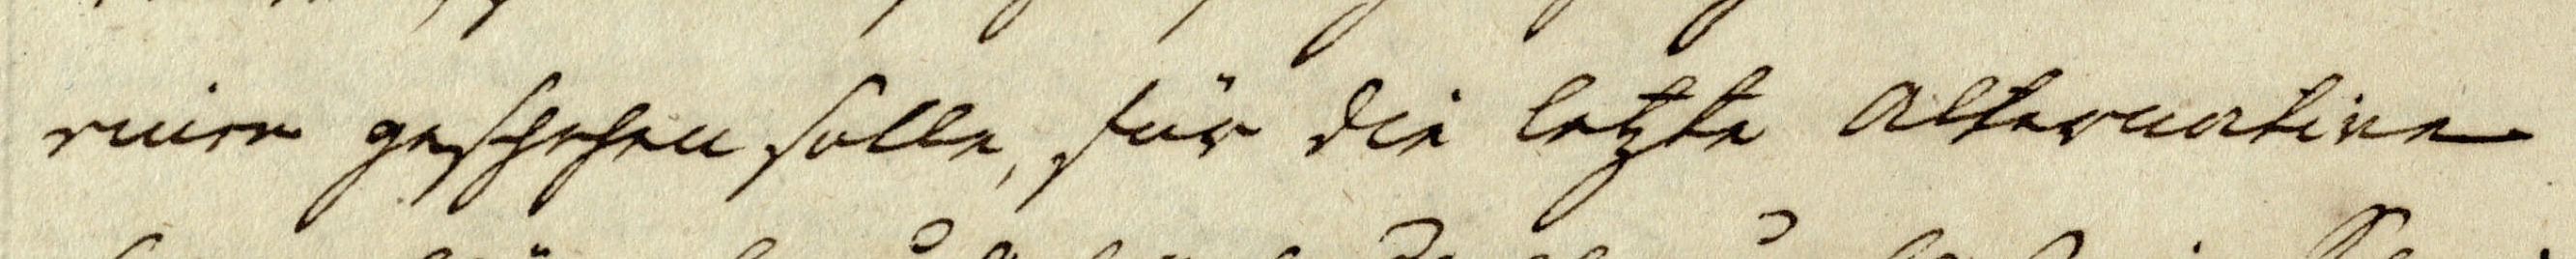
rium geschehen solle, für die letzte Alternative
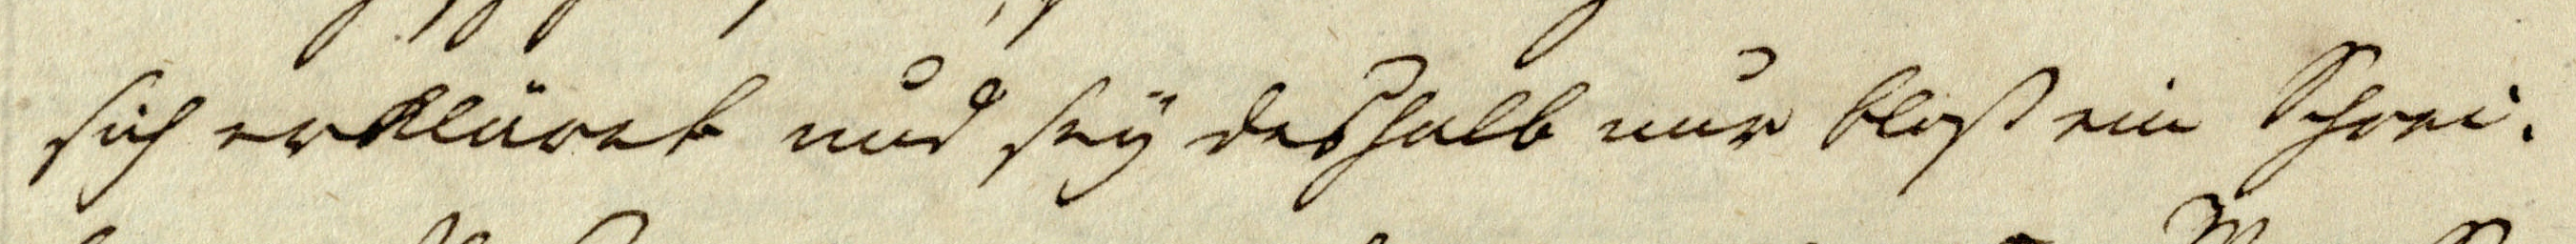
sich erkläret und seÿ deshalb nur bloß ein Schrei¬
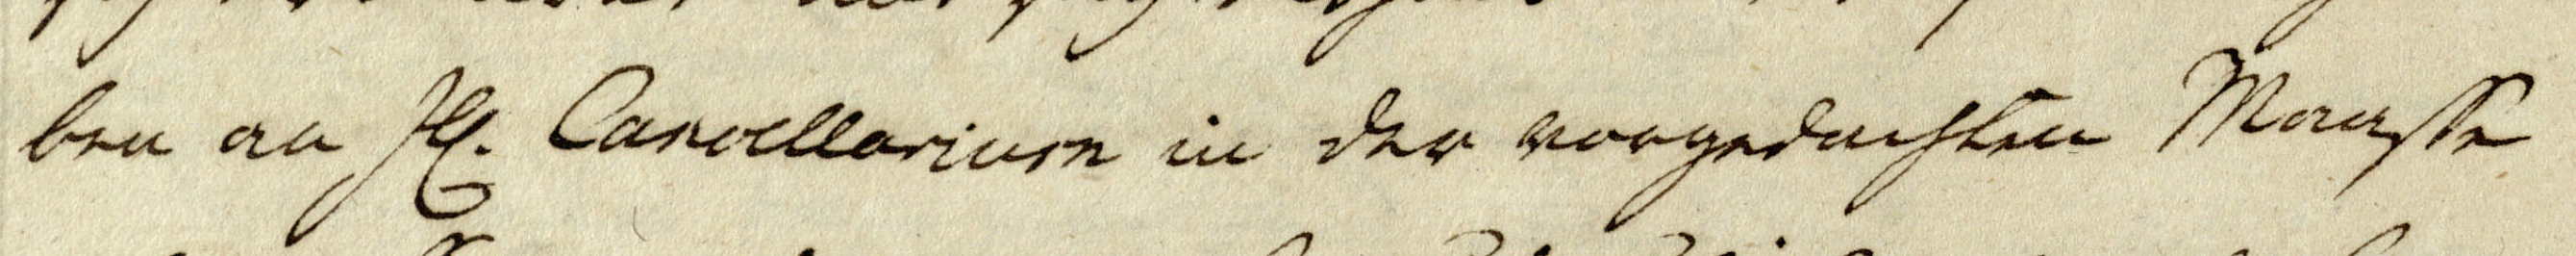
ben an Ill. Cancellarium in der vorgedachten Maasse
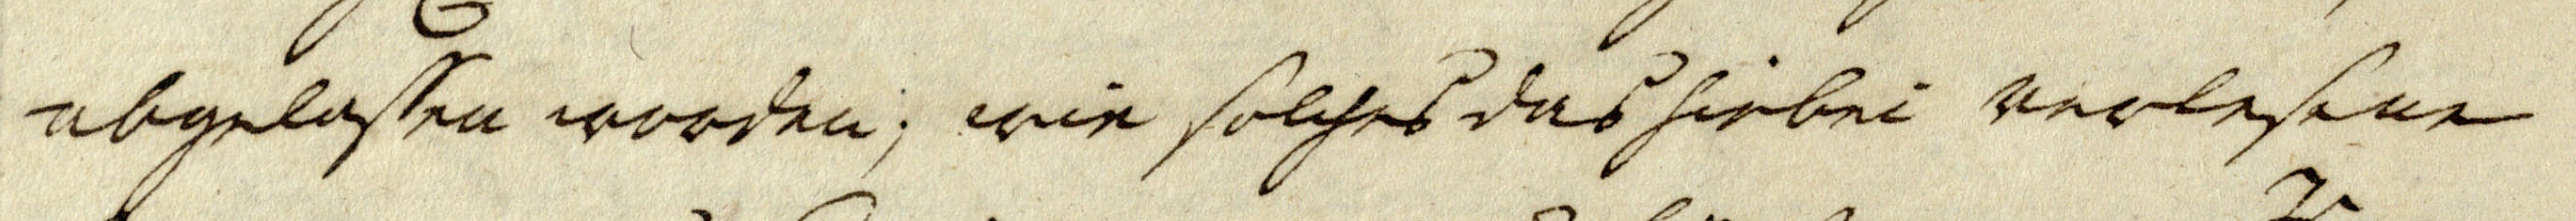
abgelassen worden, wie solches das hiebei verlesene
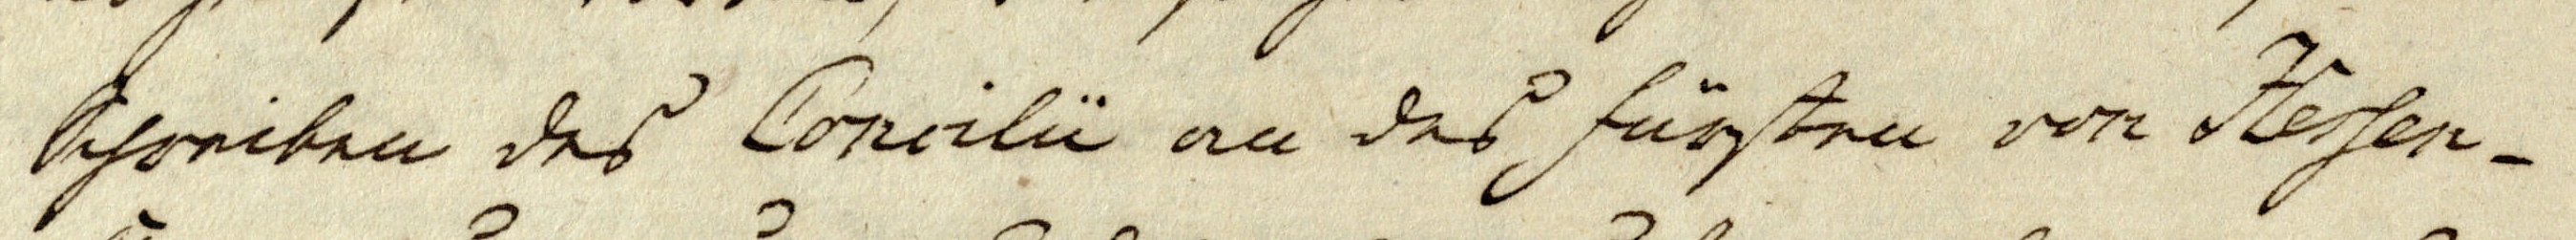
Schreiben des Concilii an des Fürsten von Hessen¬
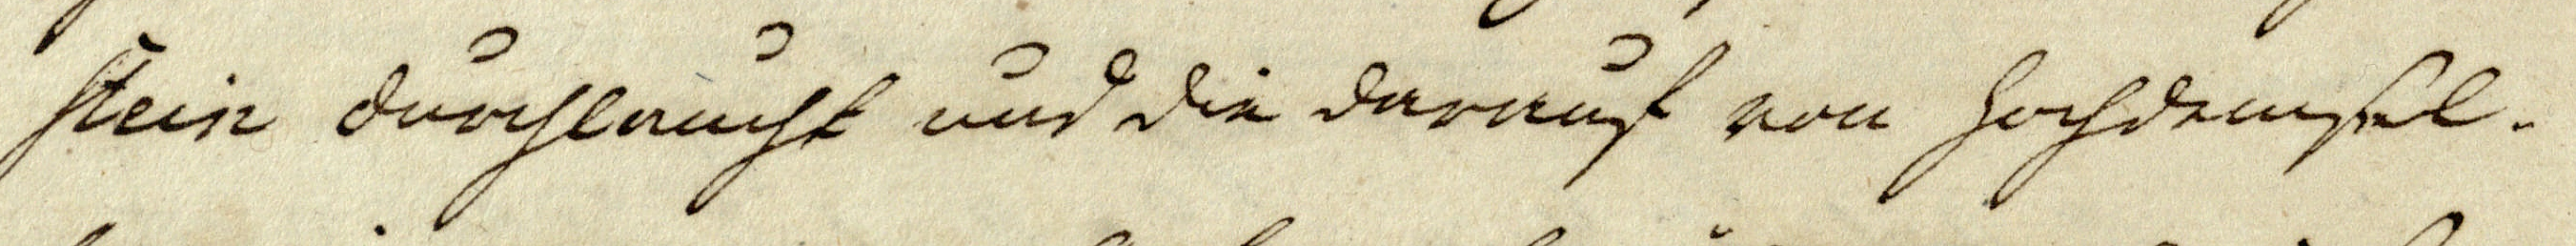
stein durchlaucht und die darauf von Hochdemsel¬
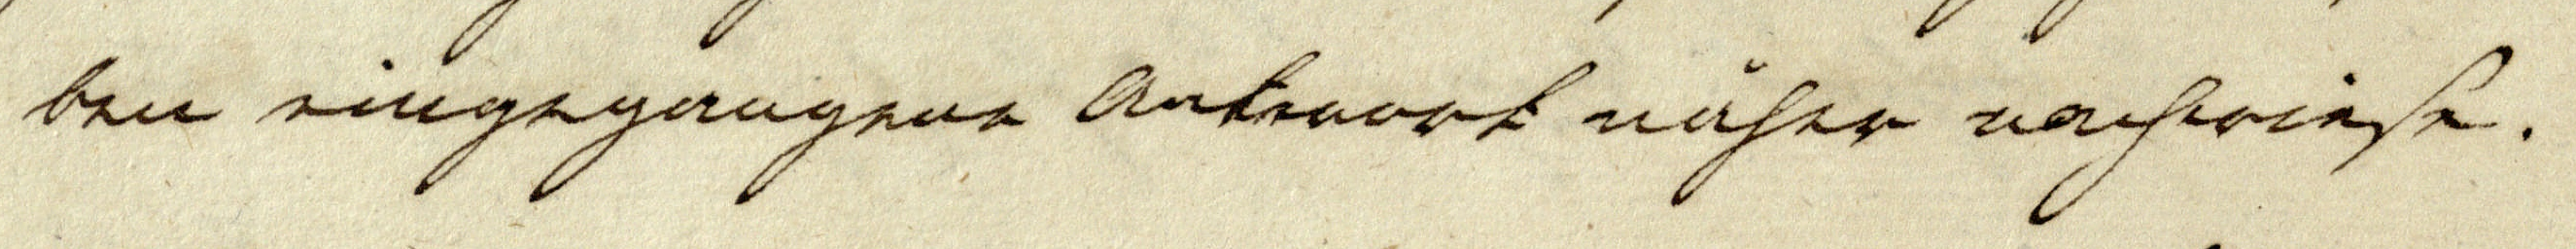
ben eingegangene Antwort näher nachewiese.
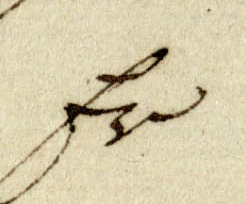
Er
